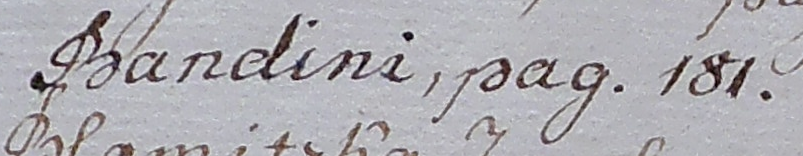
Bandini, pag. 181.
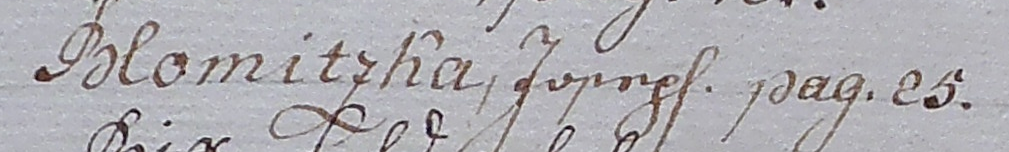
Blomitzka, Joseph. pag. 25.
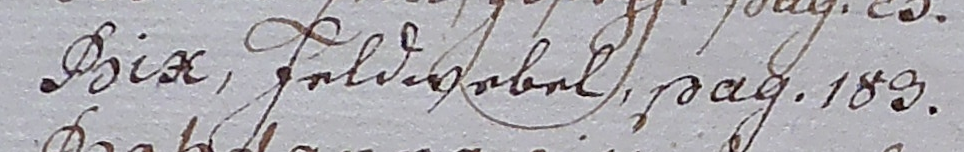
Bix, Feldwebel, pag. 183.
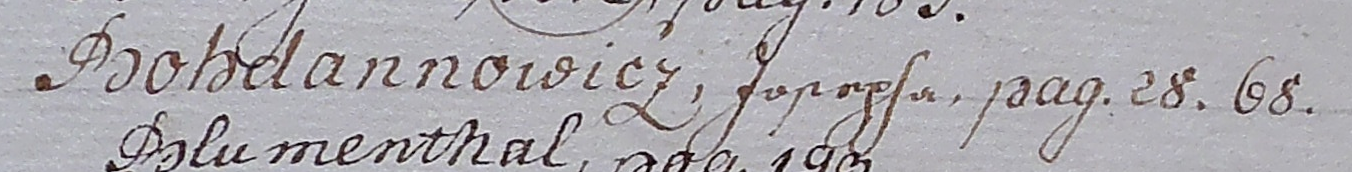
Bohdannowicz, Josepha, pag 28. 68.
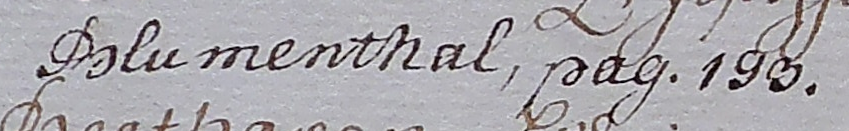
Blumenthal, pag. 193.
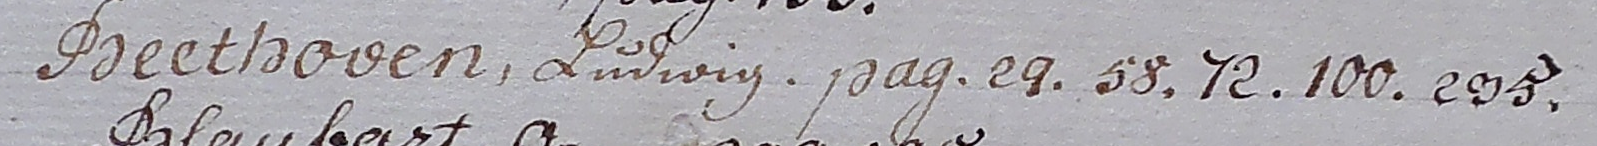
Beethoven, Ludwig. pag. 29. 58. 72. 100. 235.
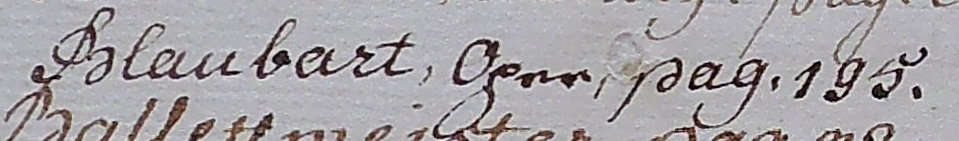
Blaubart, Oper, pag. 195.
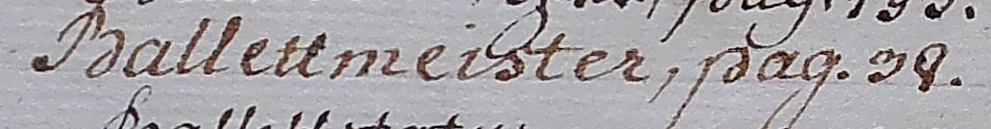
Ballettmeister, pag. 39.
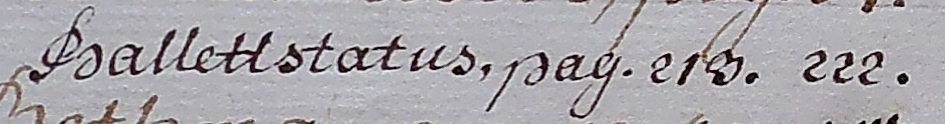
Ballettstatus, pag 213. 222.
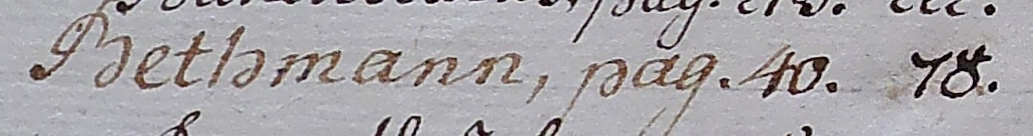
Bethmann, pag. 40. 78.
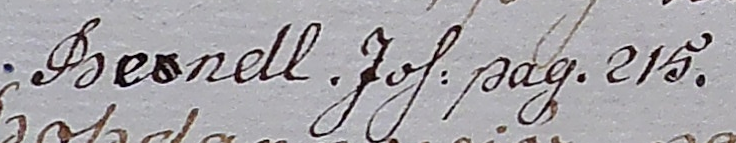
Beendl. Joh: pag. 215.
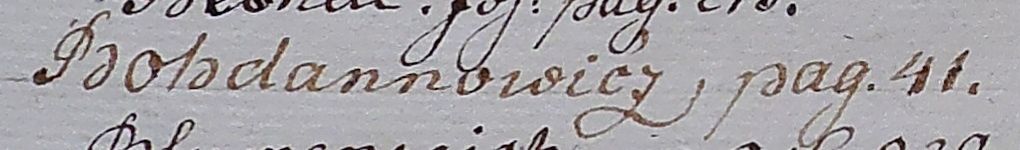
Bohdannowicz pag. 41.
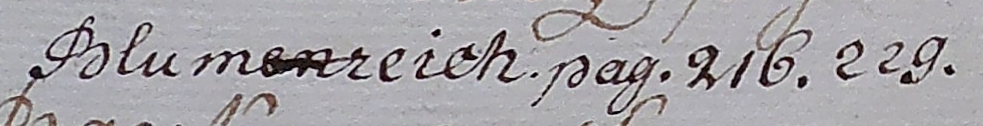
Blumenreich. pag. 216. 229.
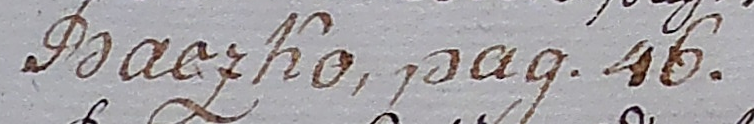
Baczko, pag. 46.
